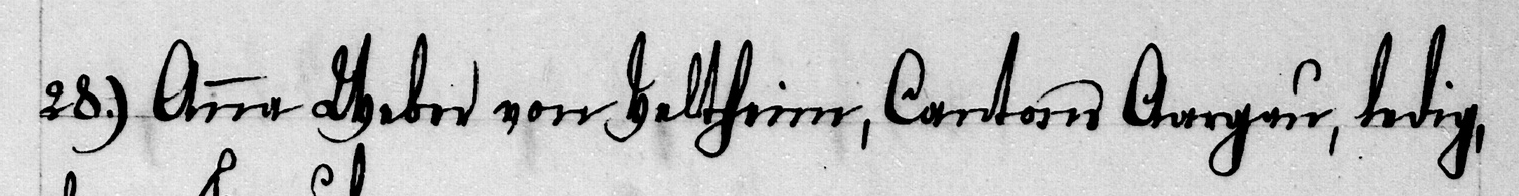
28.) Anna Weber von Veltheim, Cantons Aargau, ledig,
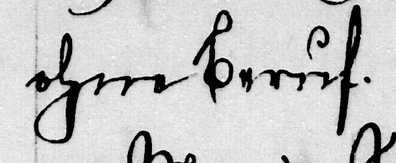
ohne Beruf.
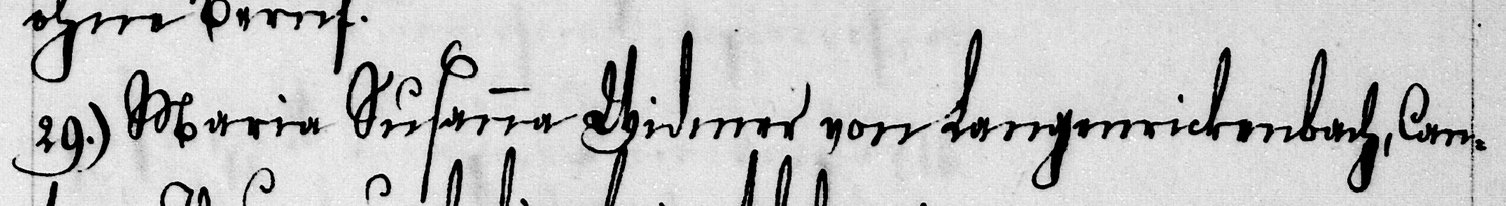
29.) Maria Susanna Widmer von Langenrickenbach, Can¬
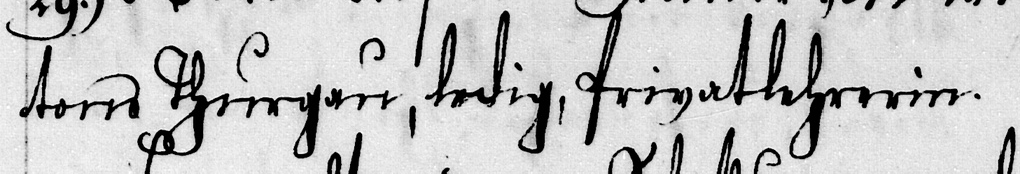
tons Thurgau, ledig, Privatlehrerin.
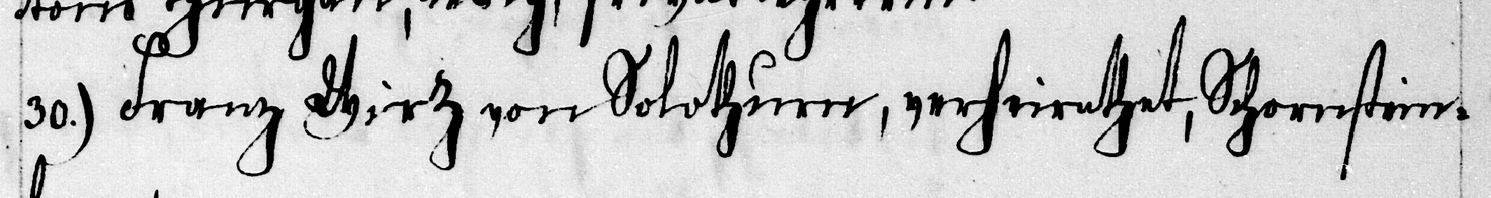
30.) Franz Wirz von Solothurn, verheirathet, Schornstein¬
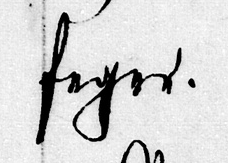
feger.
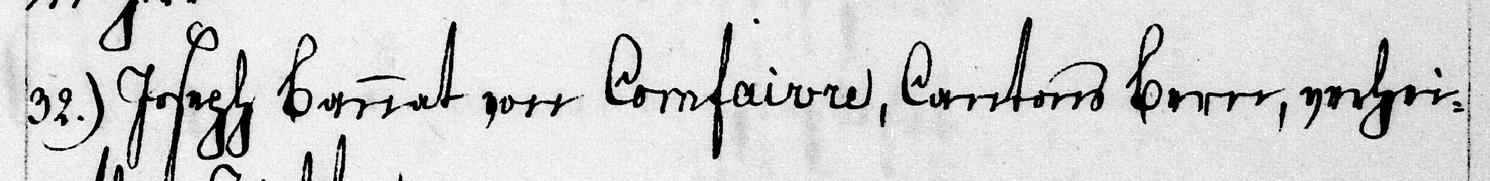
32.) Joseph Bannat von Comfaivre, Cantons Bern, verhei¬
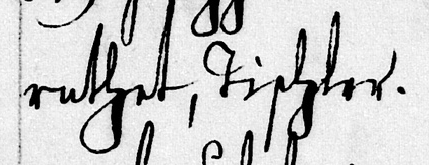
rathet, Tischler.
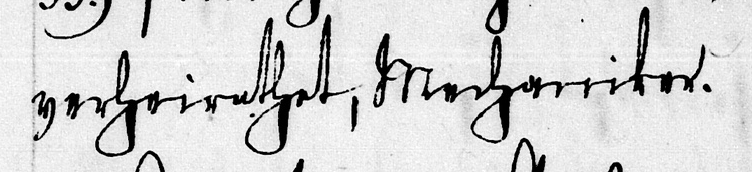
verheirathet, Mechaniker.
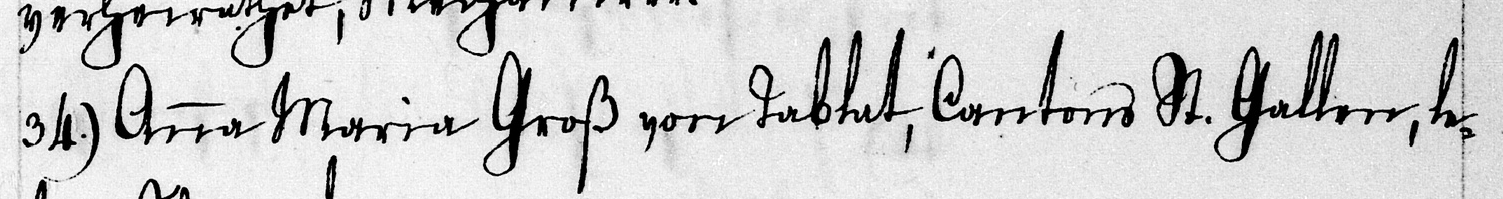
34.) Anna Maria Groß von Tablat, Cantons St. Gallen, le¬
